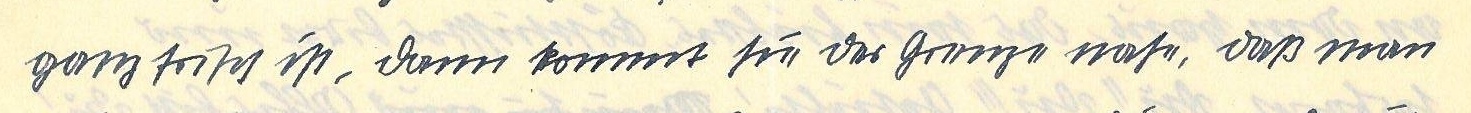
ganz frisch ist, dann kommst Du der Grenze nahe, daß man
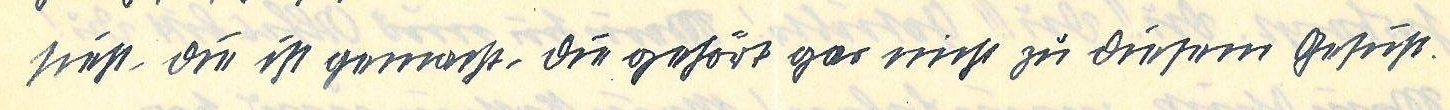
sieht, die ist gemacht, die gehört gar nicht zu diesem Gesicht.
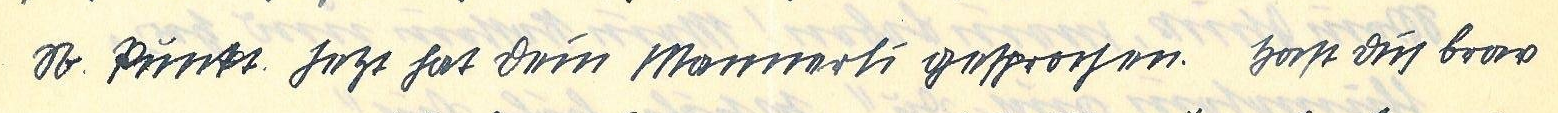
So. Punkt. Jetzt hat Dein Mannerli gesprochen. Hast Dich brav
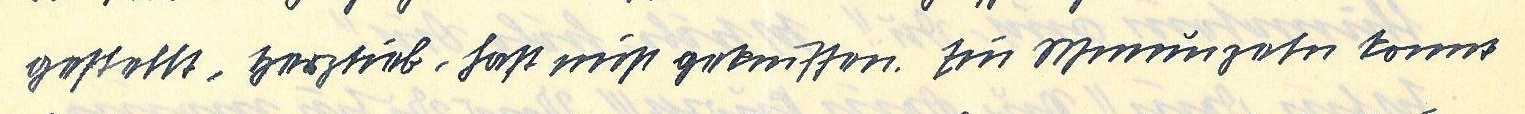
gestellt, Herzlieb, hast nicht gekniffen. Ein Schmunzeln konnt
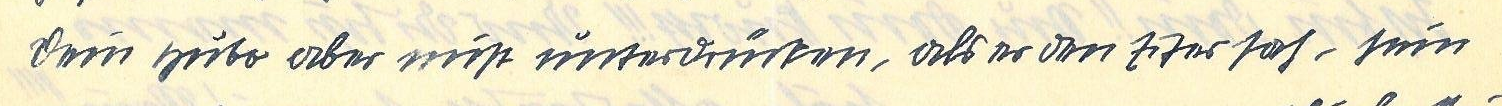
Dein Hubo aber nicht unterdrücken, als er den Eifer sah, sein
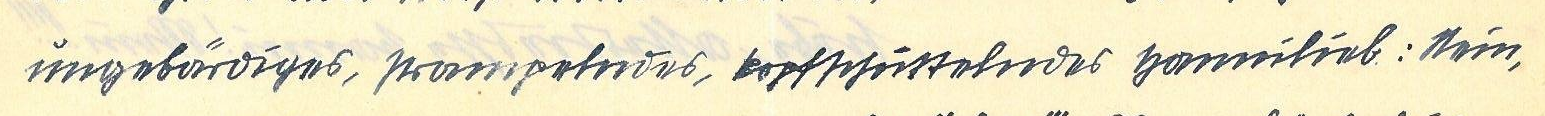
ungebärdiges, strampelndes, kopfschüttelndes lieb: Nein,
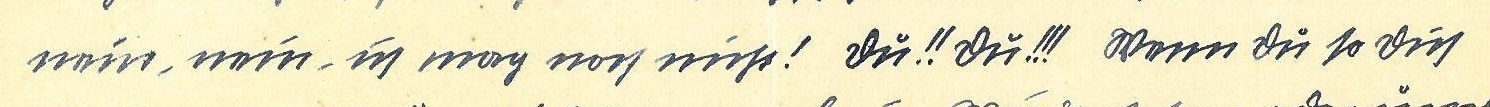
nein, nein, ich mag noch nicht! Du!! Du!!! Wenn Du so Dich
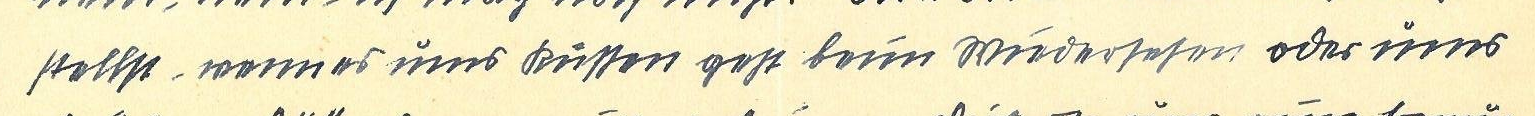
stellst, wenn es ums Küssen geht beim Wiedersehen oder ums
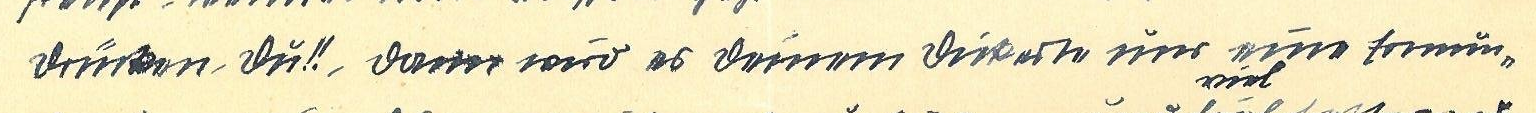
Drücken, Du!!, dann wird es Deinem Dickerle nur eine Ermun¬
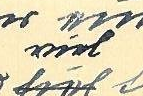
viel
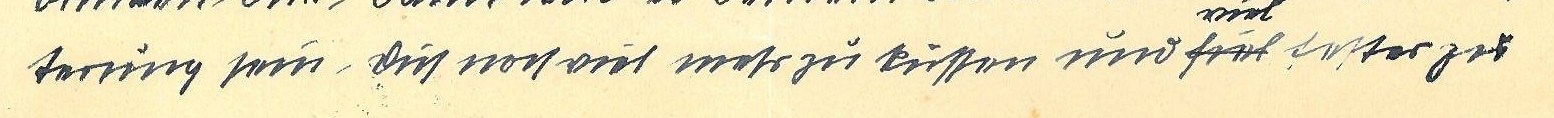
terung sein, Dich noch viel mehr zu küssen und fiel fester zu
